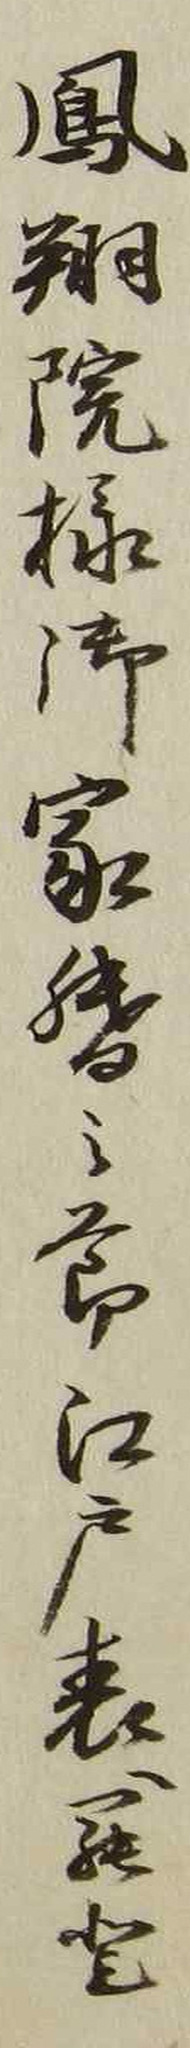鳳翔院様御家督之節江戸表へ罷登
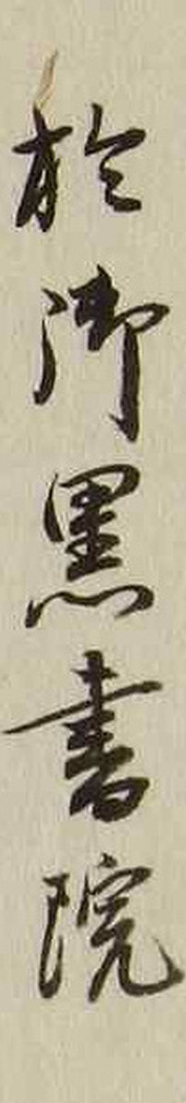於御黒書院
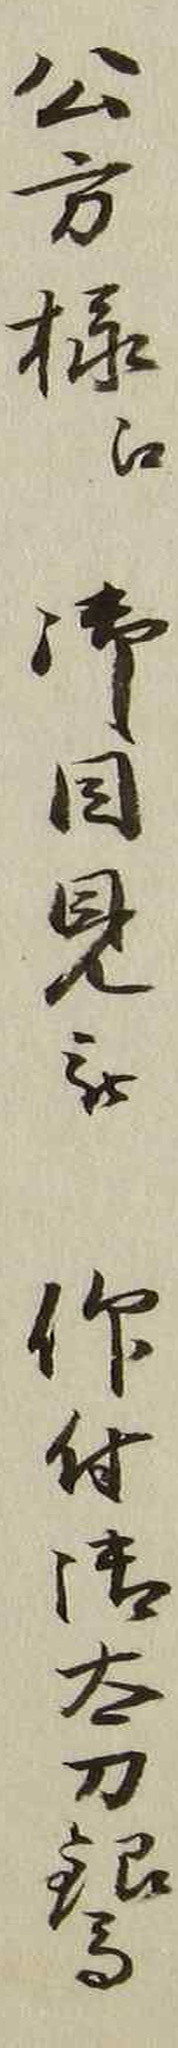公方様江御目見被仰付御太刀銀馬
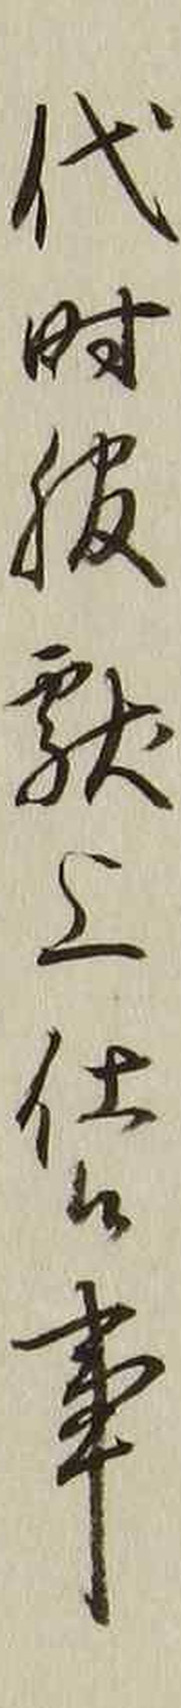代時服献上仕候事
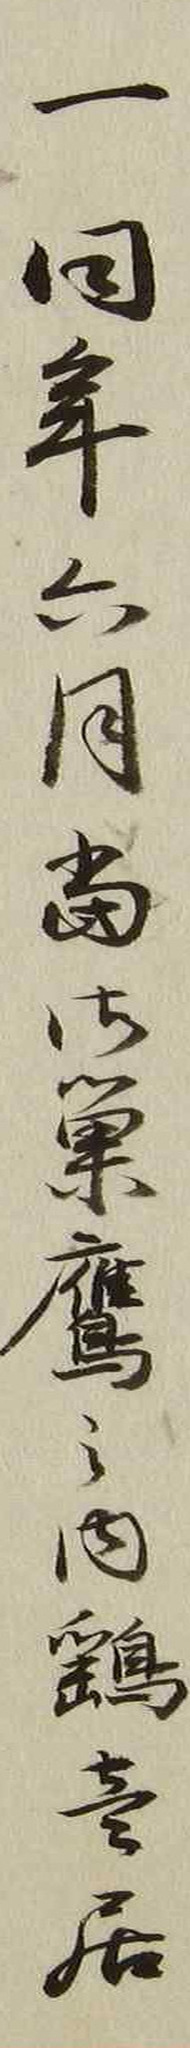一同年六月当御巣鷹之内鷂壱居
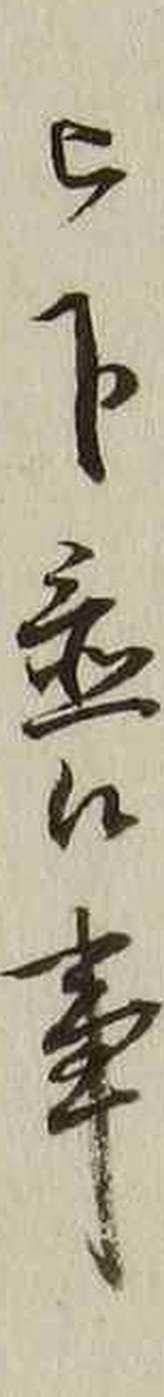被下置候事
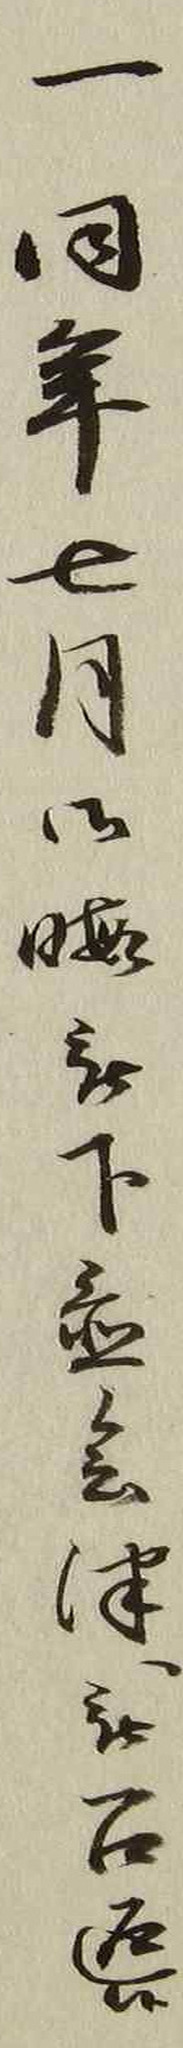一同年七月御暇被下置会津へ被召返候
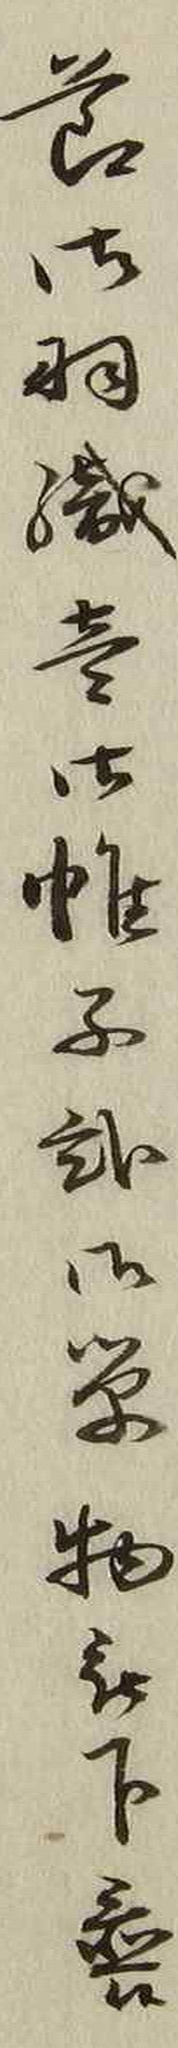節御羽織壱御帷子弐御単物被下置候
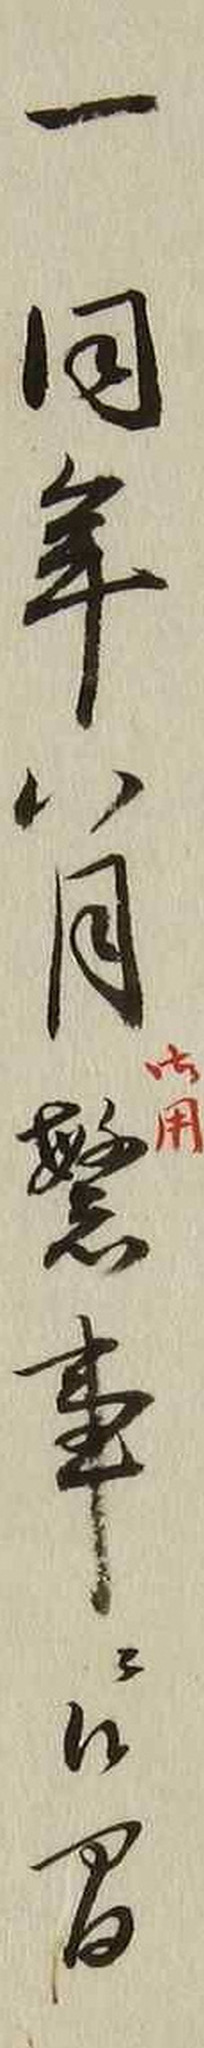一同年八月御用繁事に候間
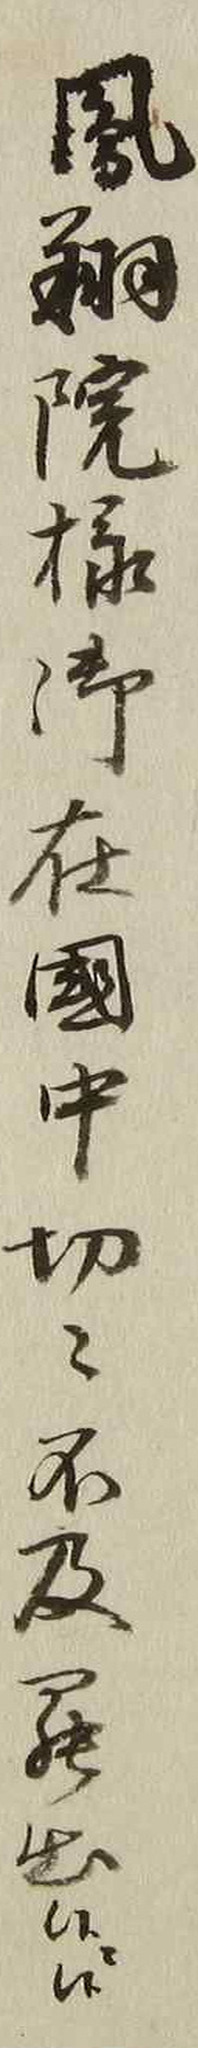鳳翔院様御在国中切に不及罷出候に候
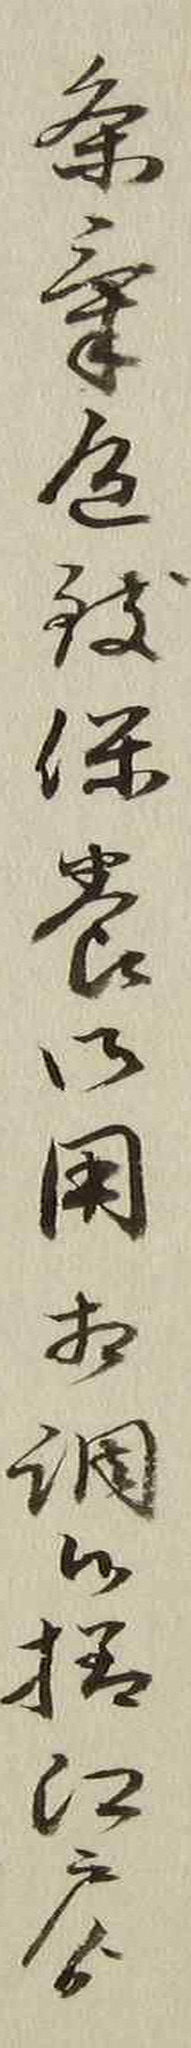条気色致保養御用相調候様江戸ゟ
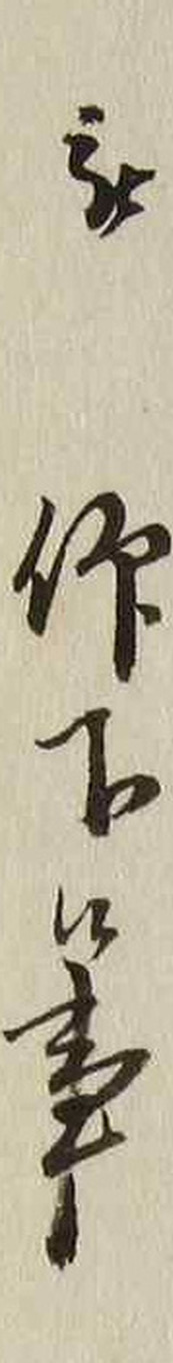被仰下候事
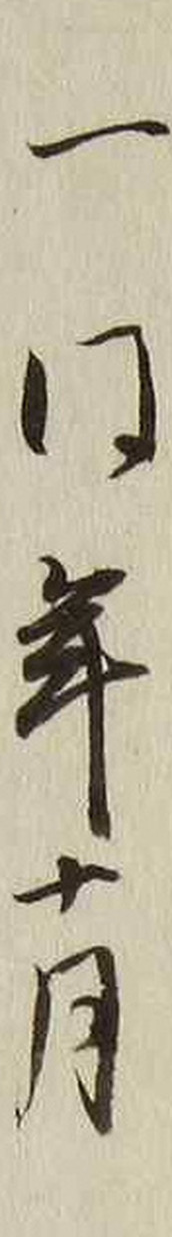一同年十月
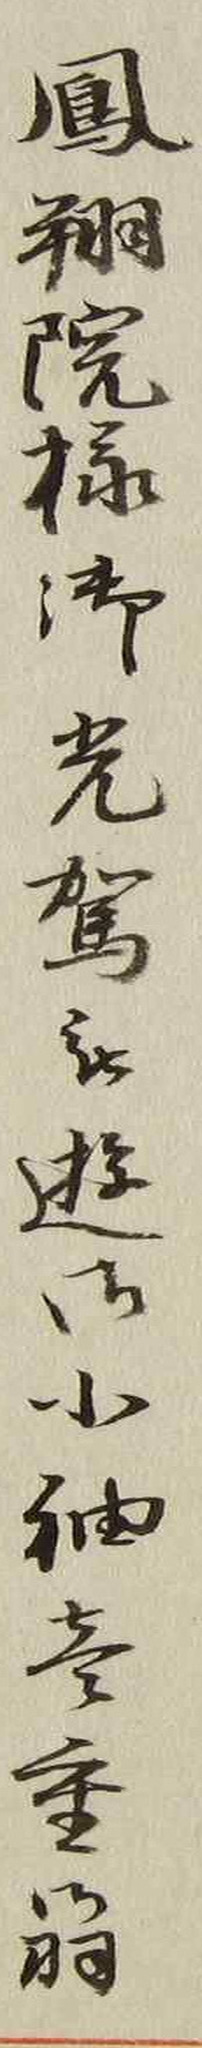鳳翔院様御光駕被遊御小袖壱重御羽
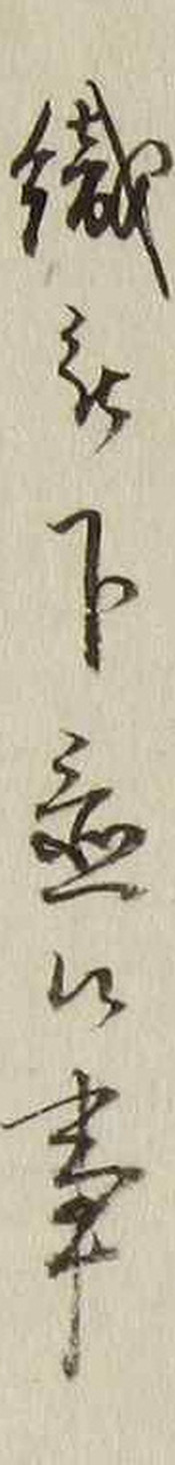織被下置候事
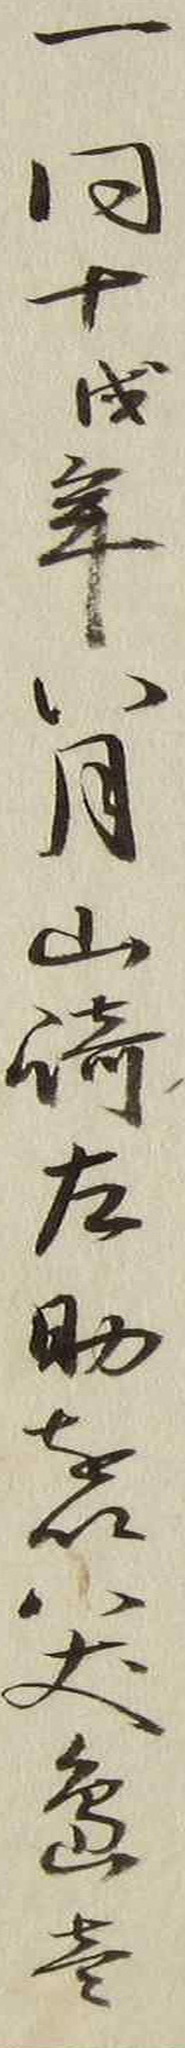一同十戌年八月山崎左助を以八丈嶋壱
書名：諸士系譜　巻之125　た之部1
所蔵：会津若松市立会津図書館
